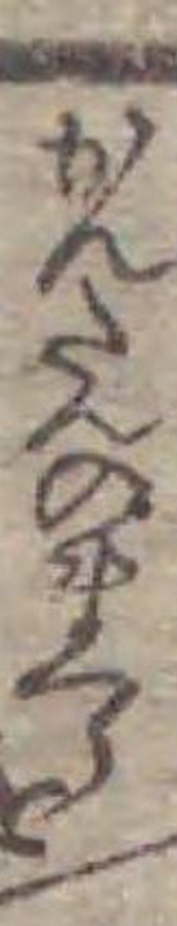かんたんのまくらを
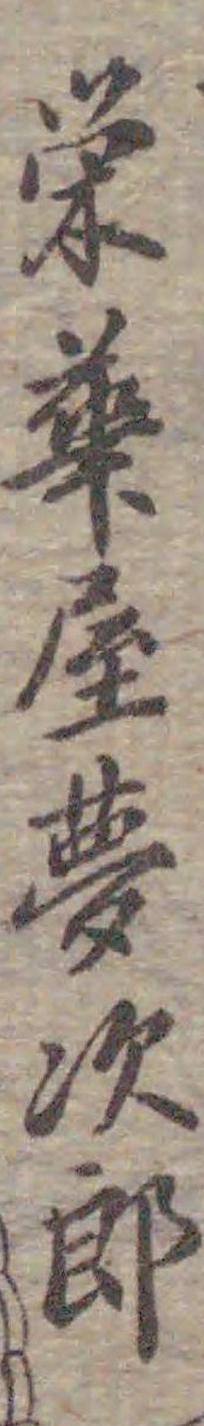栄華屋夢次郎
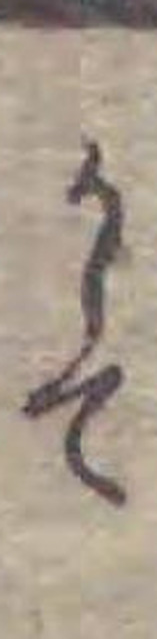かして
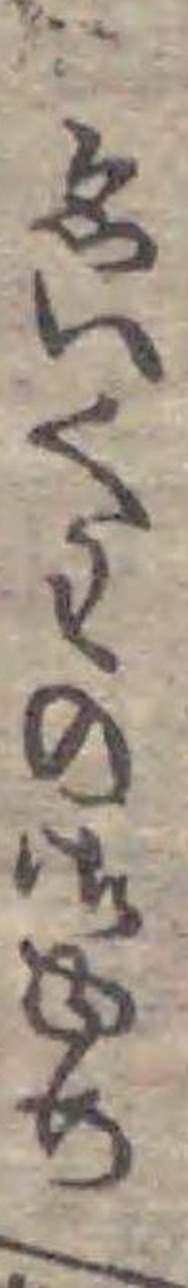ゑいくわの御夢
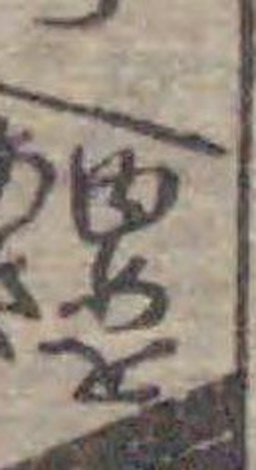ゆめを
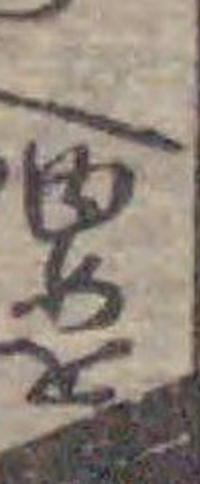ゆめを
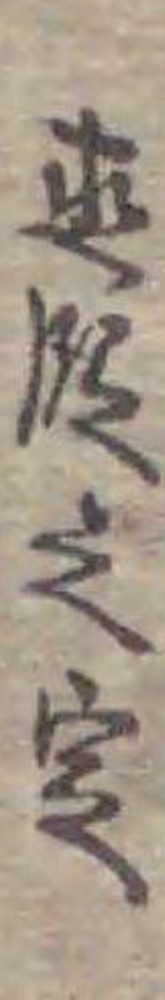直段之定
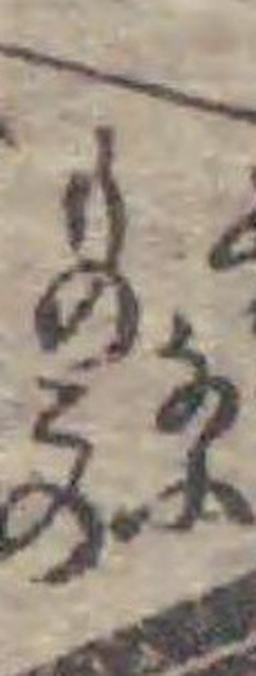ものこの
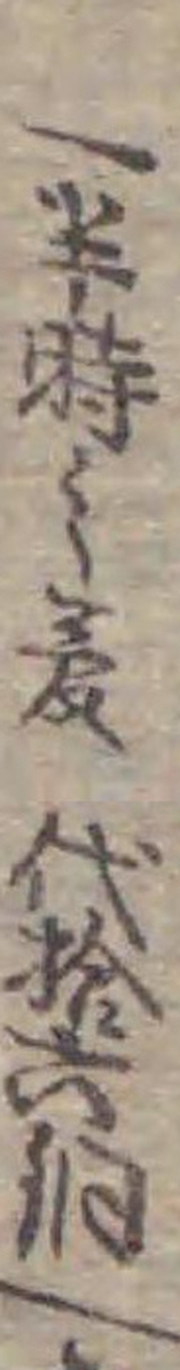一半時之夢代拾六銅
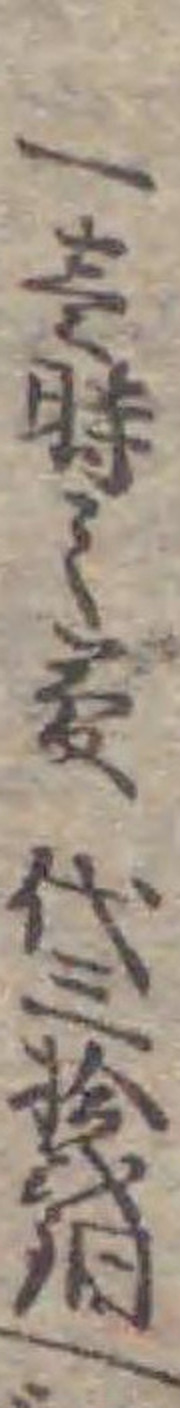一壱時之夢代三拾弐銅
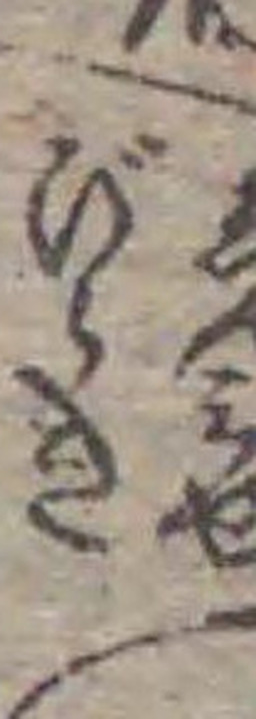びらき
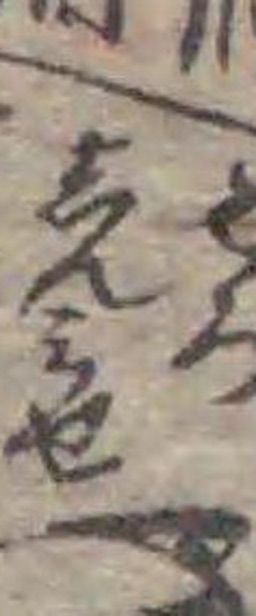しんみせ
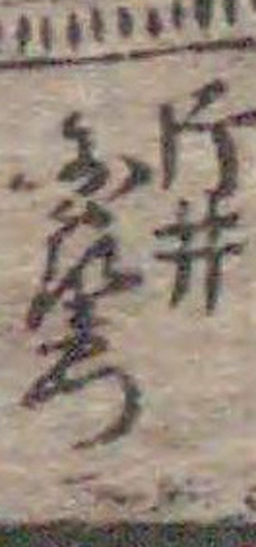国左衛門
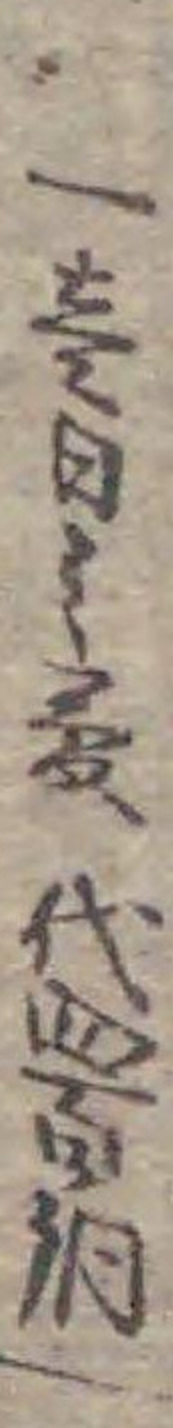一壱日之夢代四百銅
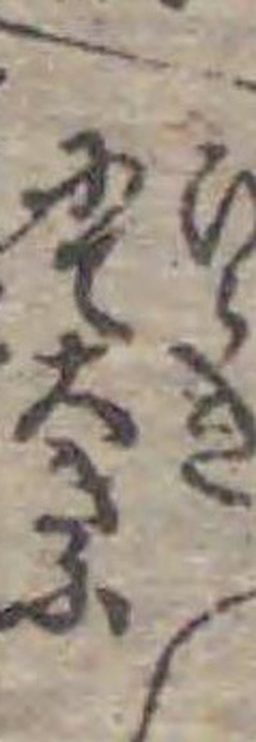にて大きに
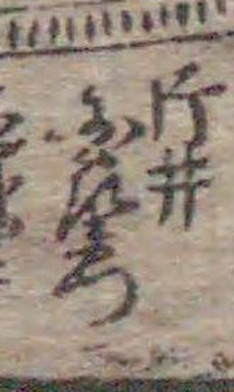国左衛門
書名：見徳一炊夢 : 3巻
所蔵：国立国会図書館 National Diet Library, JAPAN
